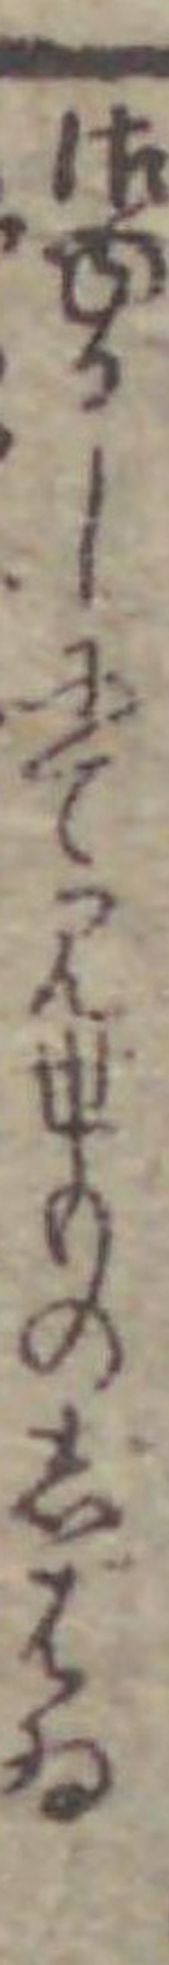御ゆるしにて見世ものしはゐ
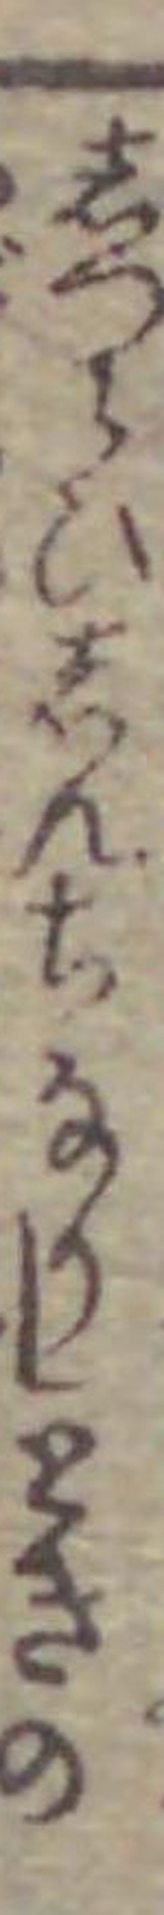しつらひしんちなりしときの
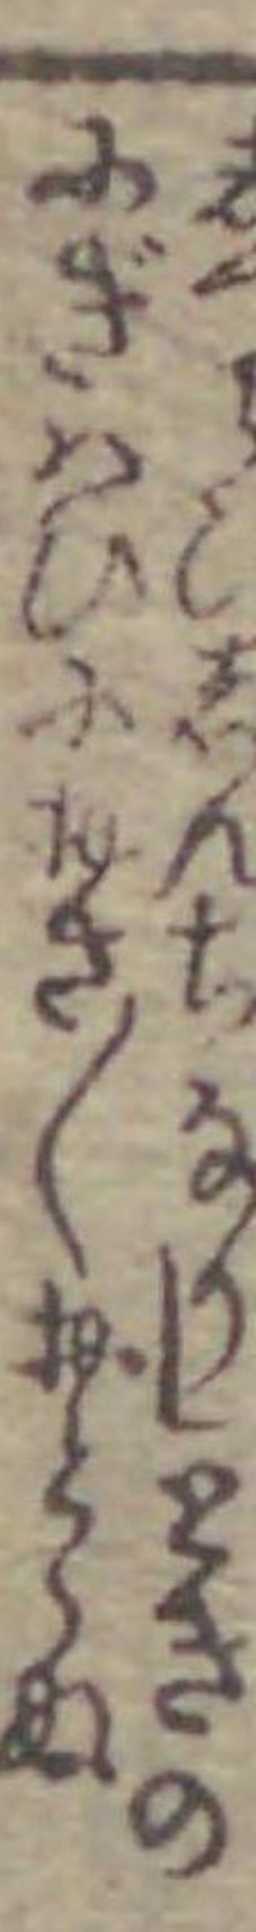にぎはひにおさ〳〵おとらぬ
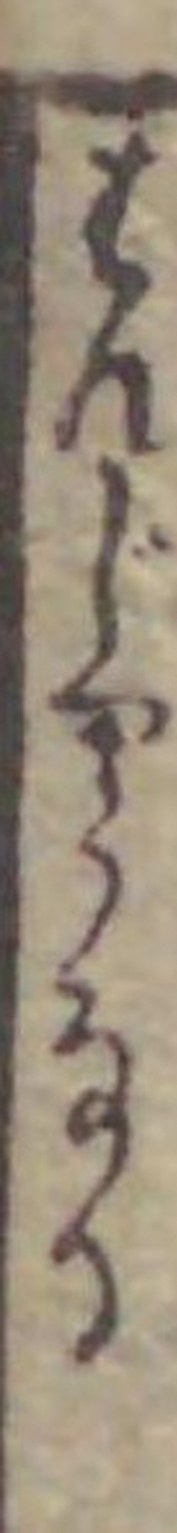はんじやうなり
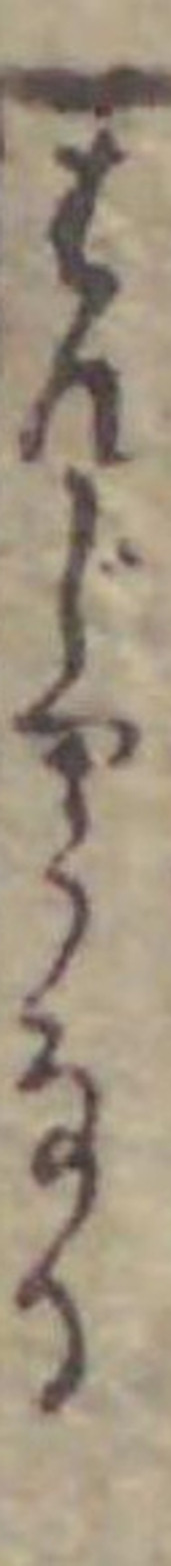はんじやうなり
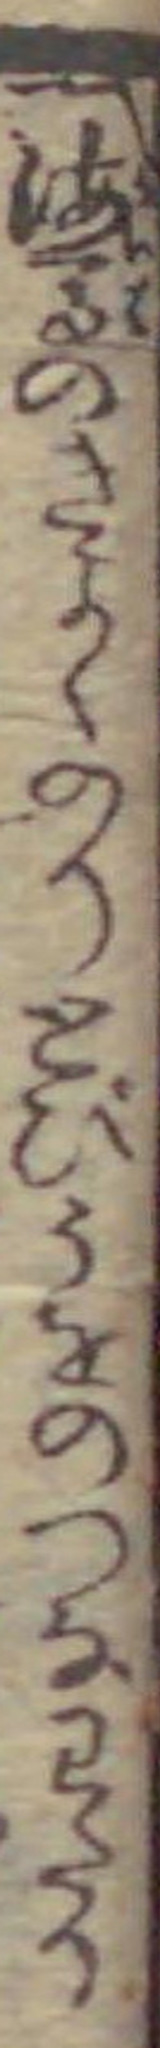〽海馬のきよくのりとびうをのつなわたり
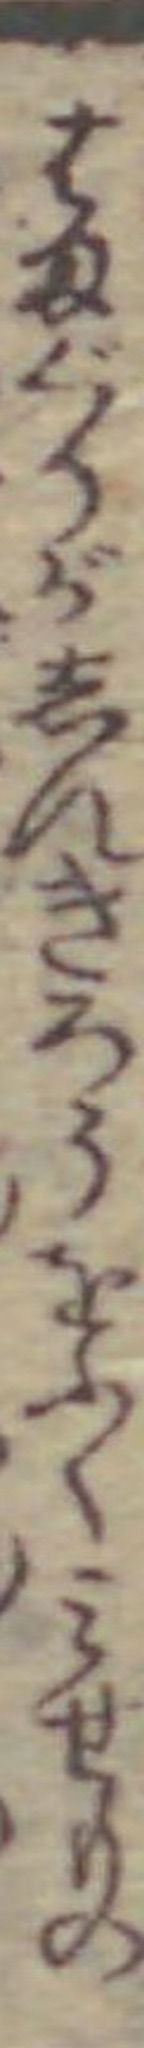はまぐりがしんきろうをふくみせもの
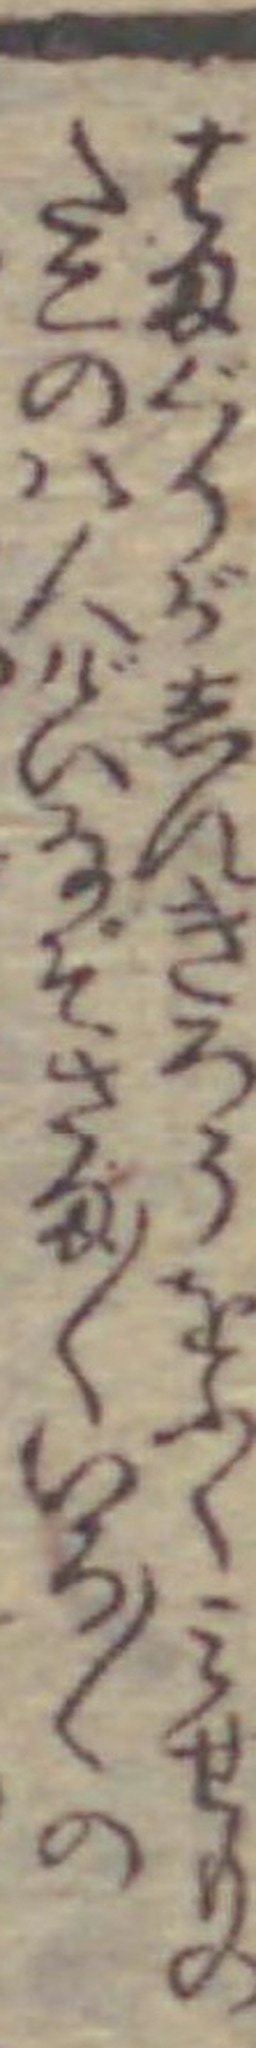たこの八人げいなぞさま〳〵いろ〳〵の
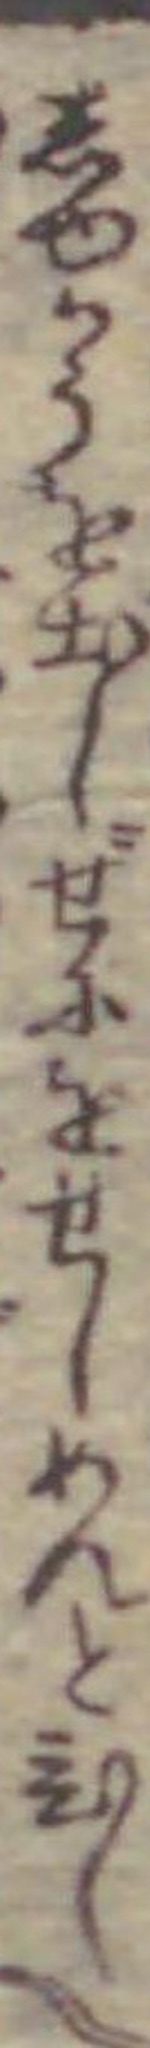しゆかうを出しぜにをせしめんとひし
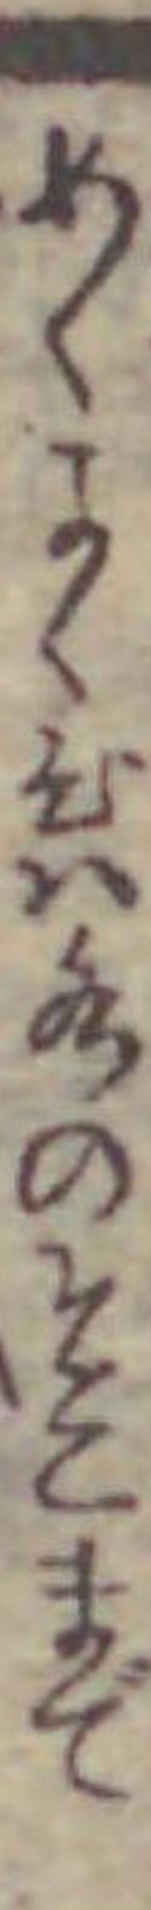めくよく心は水のそこまで
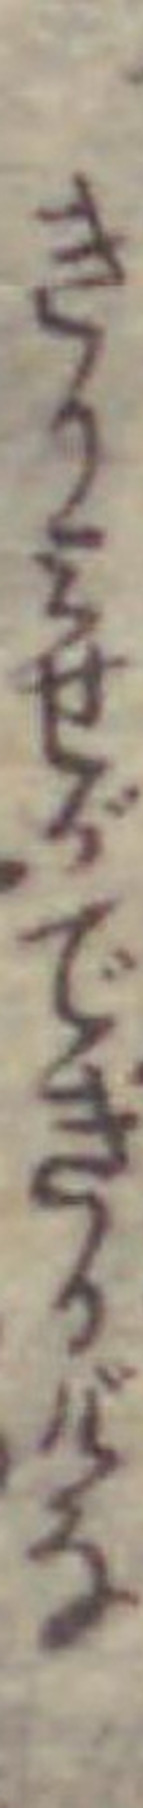きりみせができるげな

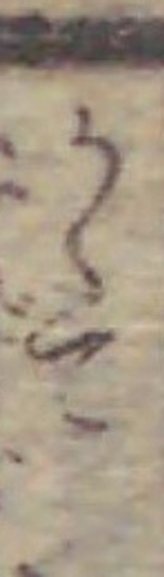かくて
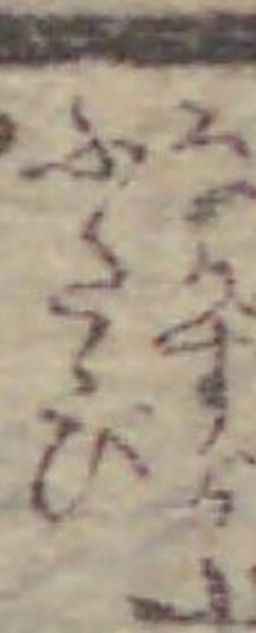ふたゝび
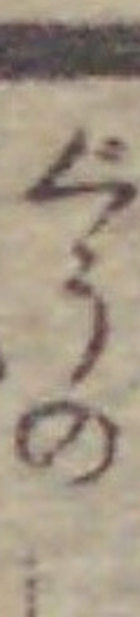ぐうの
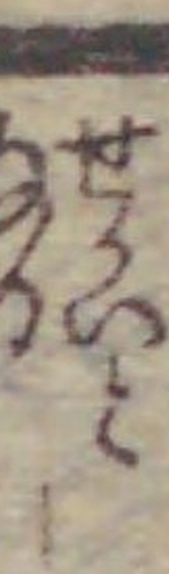せかいと
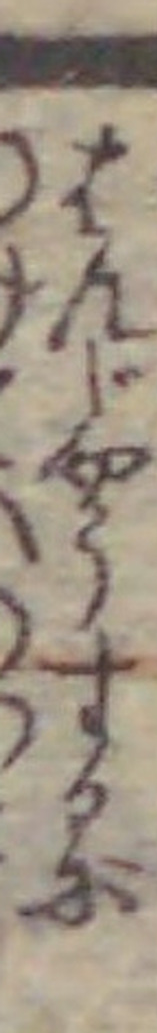はんじやうするに
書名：箱入娘面屋人魚 3巻
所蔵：国立国会図書館 National Diet Library, JAPAN
